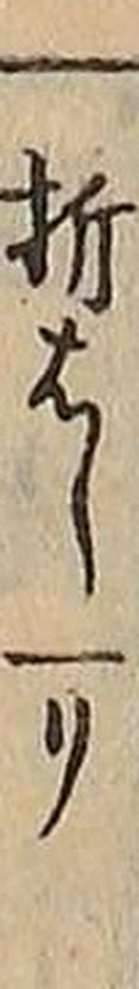折はし一リ
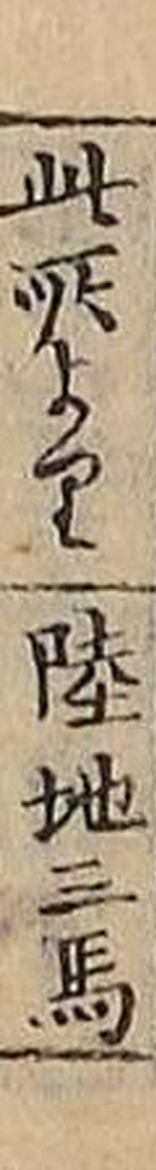此所より陸地三馬
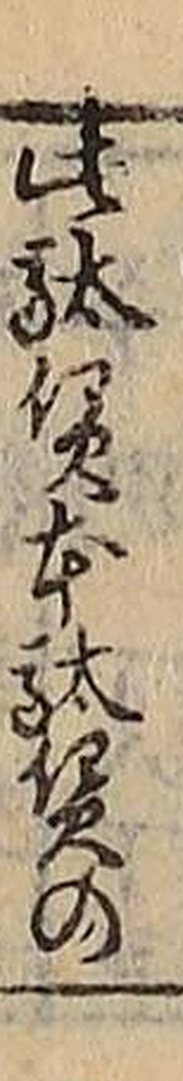此駄賃本駄賃の
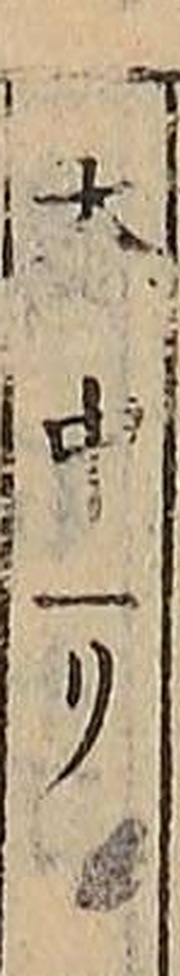大中一リ
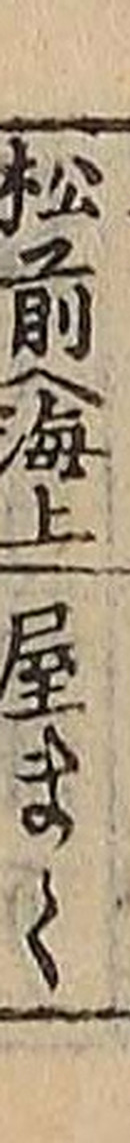松前へ海上屋まて
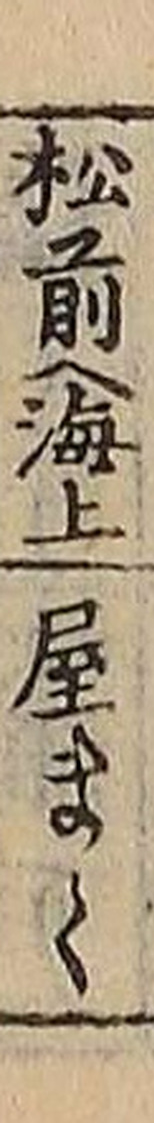松前へ海上屋まて
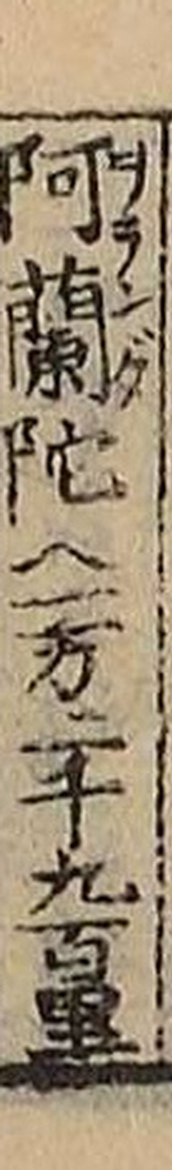阿蘭陀へ一万二千九百里
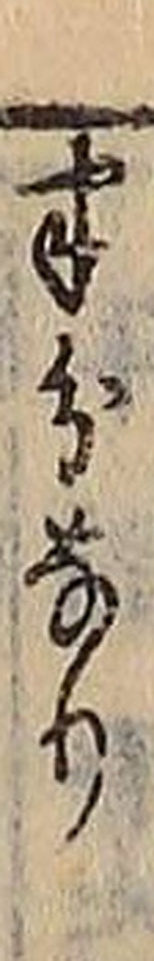半分なり
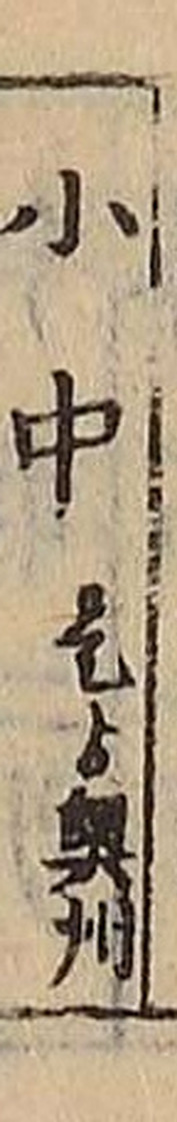小中是ゟ奥州
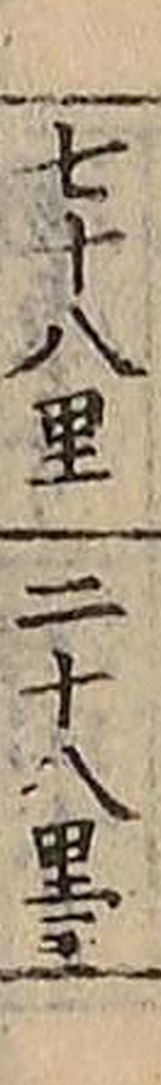七十八里二十八里ヨ
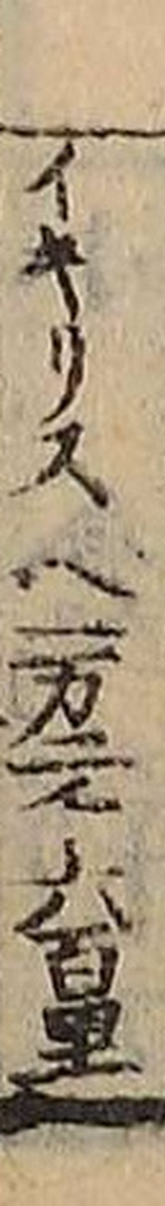イキリスへ一万二千六百里
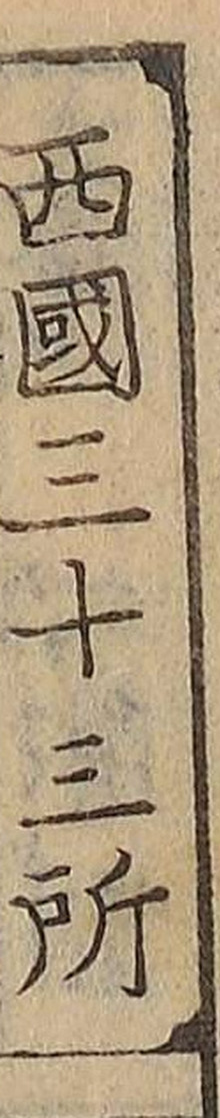西国三十三所
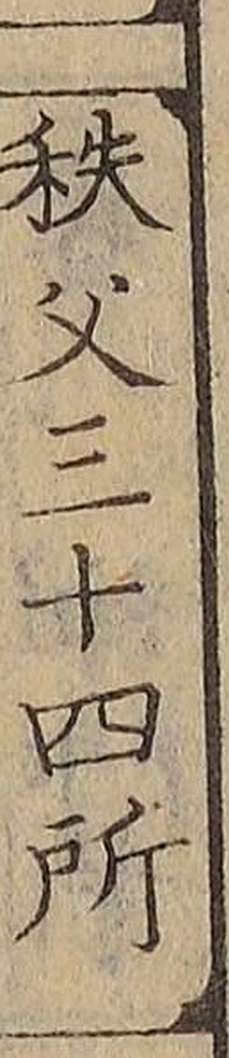秋父三十四所
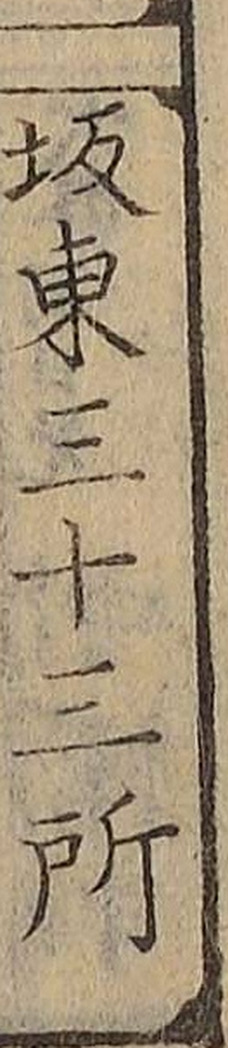坂東三十三所
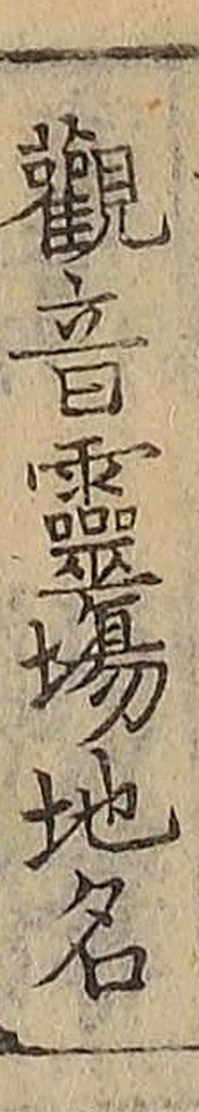観音霊場地名
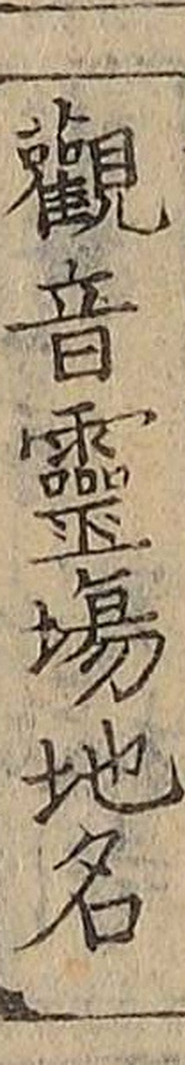観音霊場地名
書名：旅行用心集
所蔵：神戸大学附属図書館 国文学研究資料館
